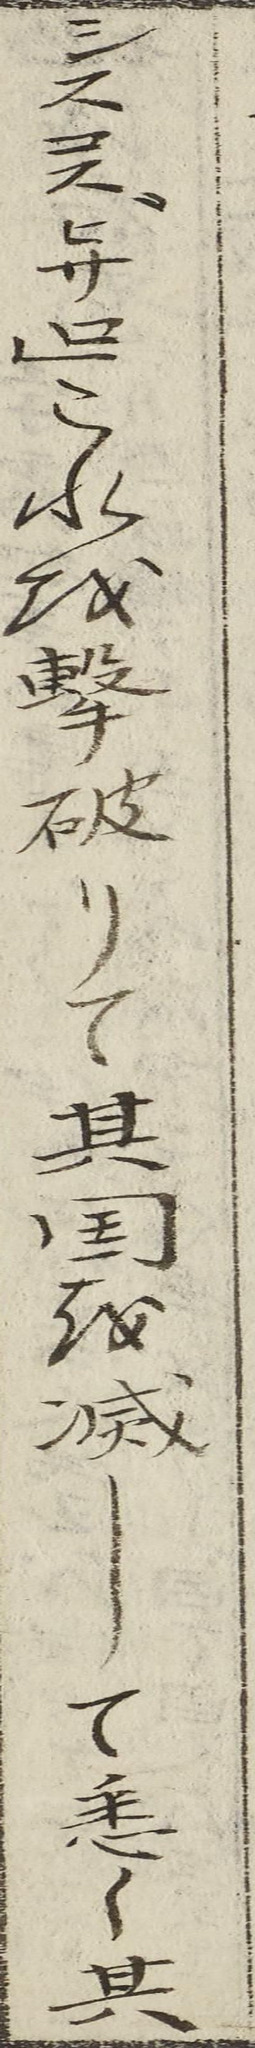シスコス。ヒサロ」これを撃破りて其国を滅して悉く其

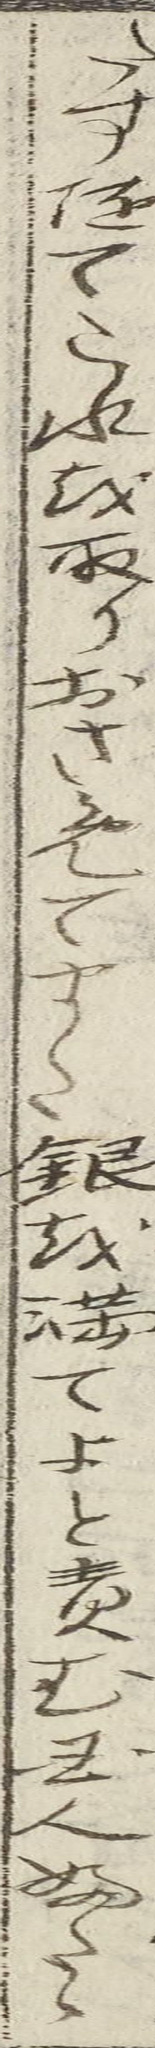たす随てこれを取りおさめてまた銀を満てよと責む国人ふたゝ
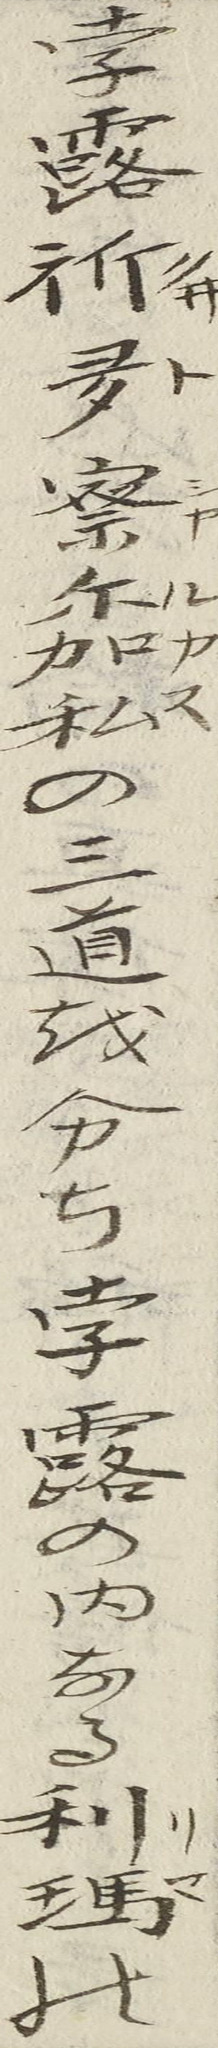孛露祈多察尓加私の三道を分ち孛露の内なる利瑪の
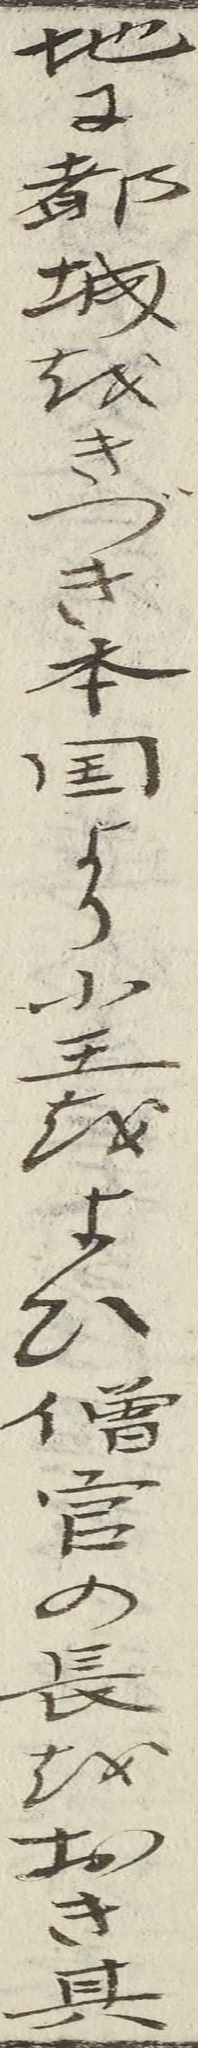地に都城をきづき本国より小王をよひ僧官の長をおき其
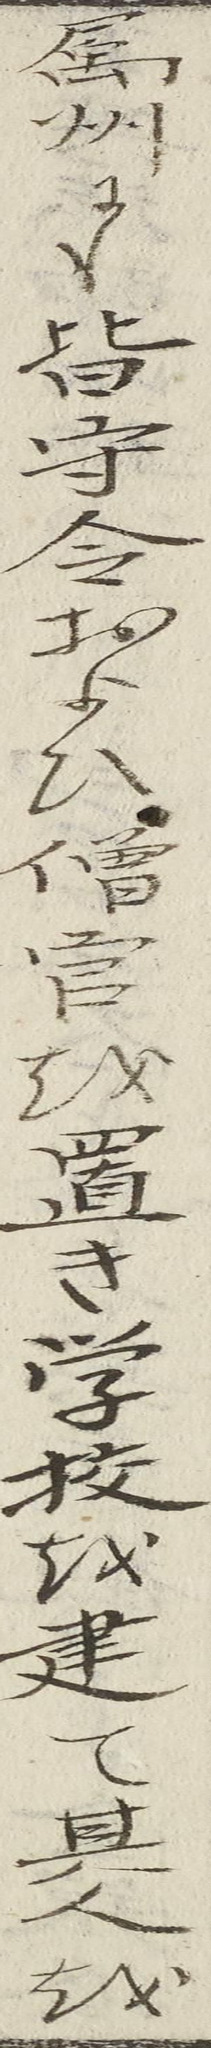属州にもモナ守令およひ僧官を置き学校を建て其人を
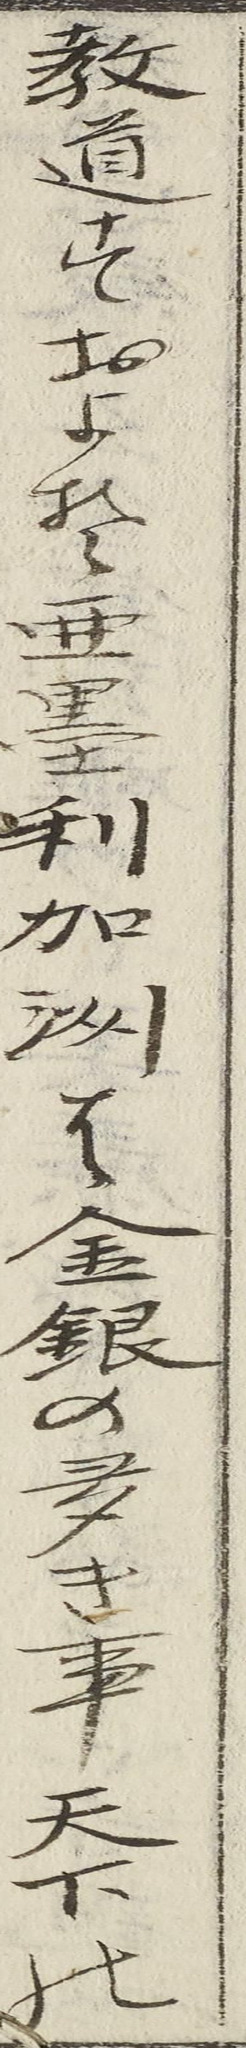教道すおよそ亜墨利加洲は金銀の多き事天下の
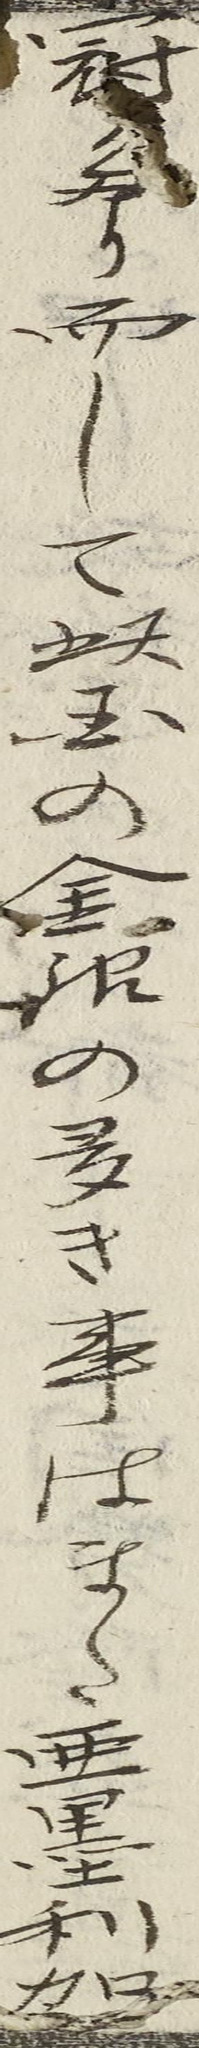冠りたり而して此国の金銀の多き事はまた亜墨利加
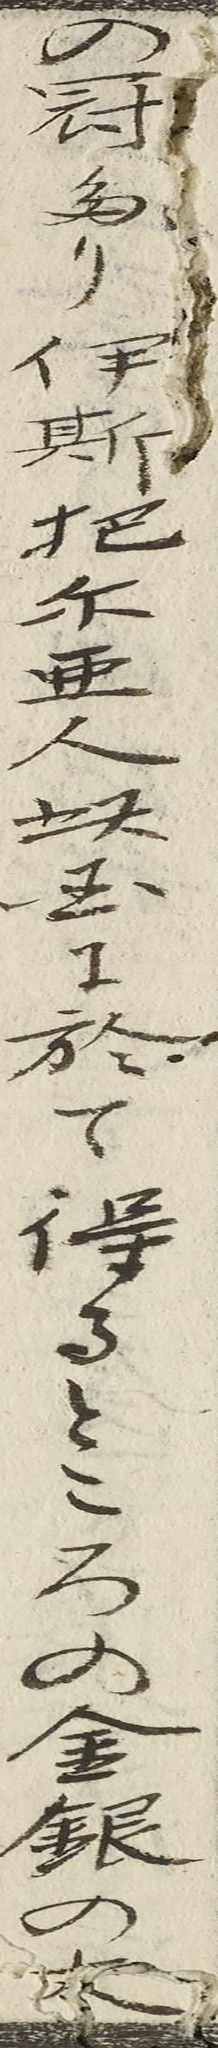の冠たり伊斯把尓亜人此国に於て得るところの金銀の求
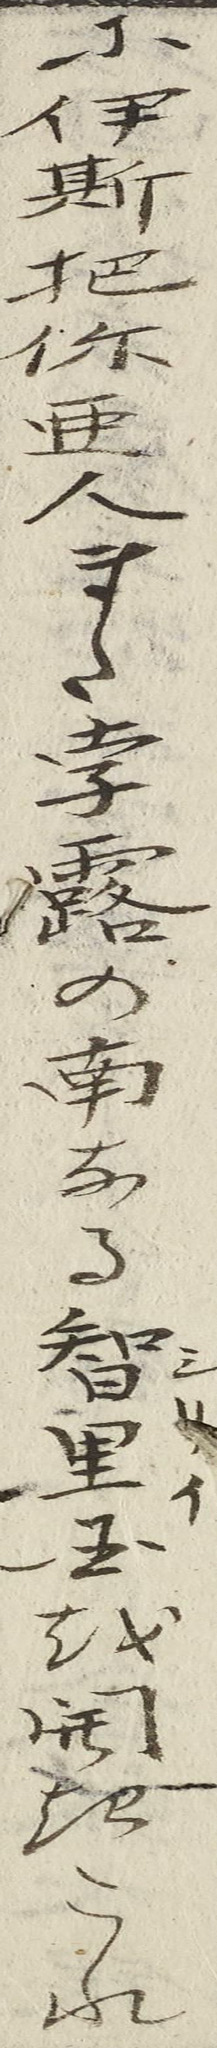に伊斯把你亜人又孛露の南なる智里国を開きこれ
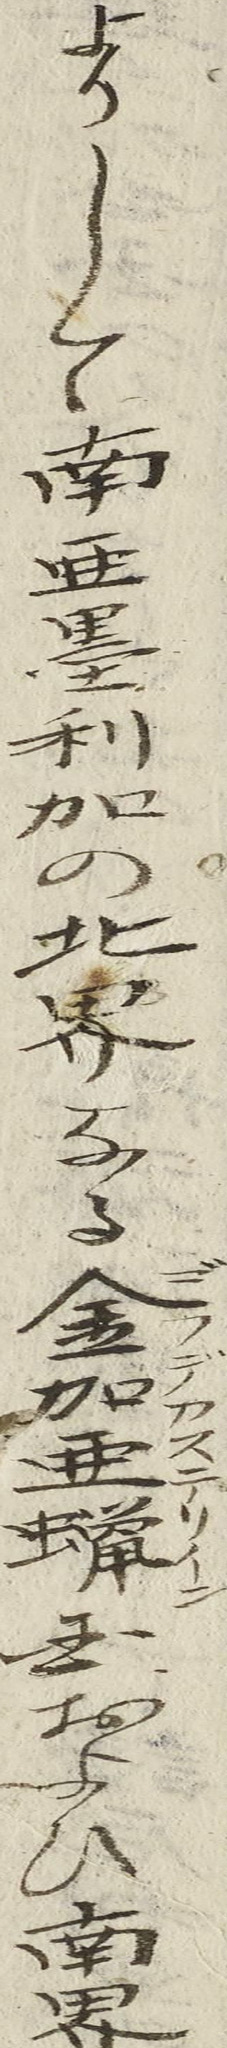よりして南亜墨利加の北界なる金加亜蝋国およひ南界
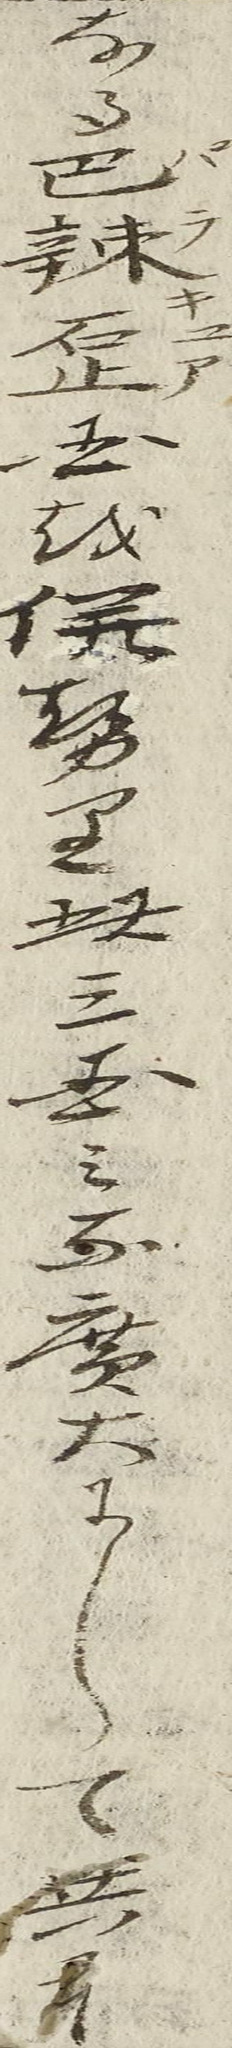なる巴辣石止国を併せり此三国ミな広大にして共に
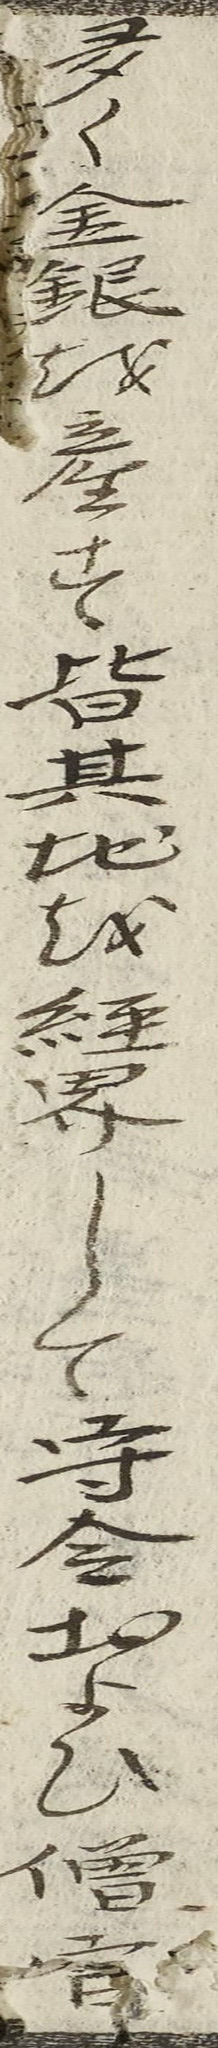多く金銀を産す皆其地を経界して守令およひ僧官
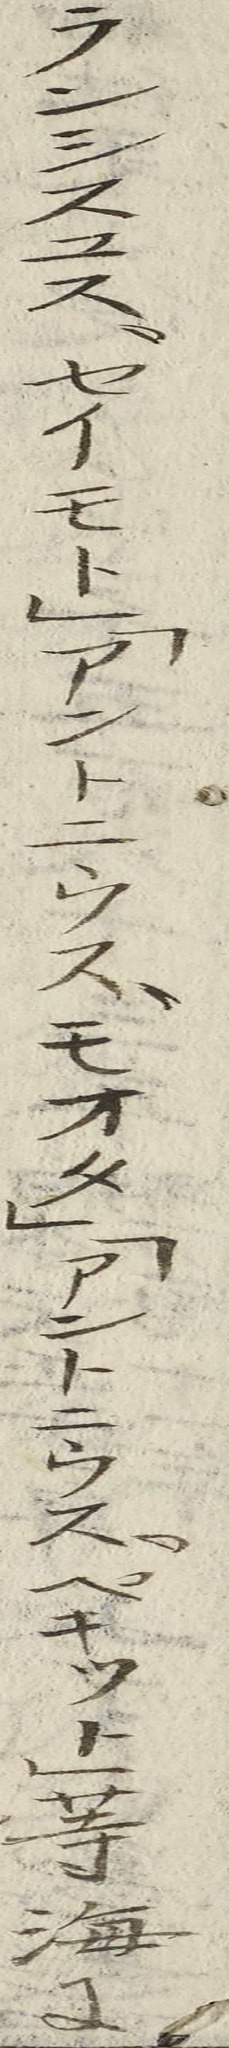ランしスユス。セイモト」「アント。二ウス。モオタ」「アント二ウス。ぺキット」等海に
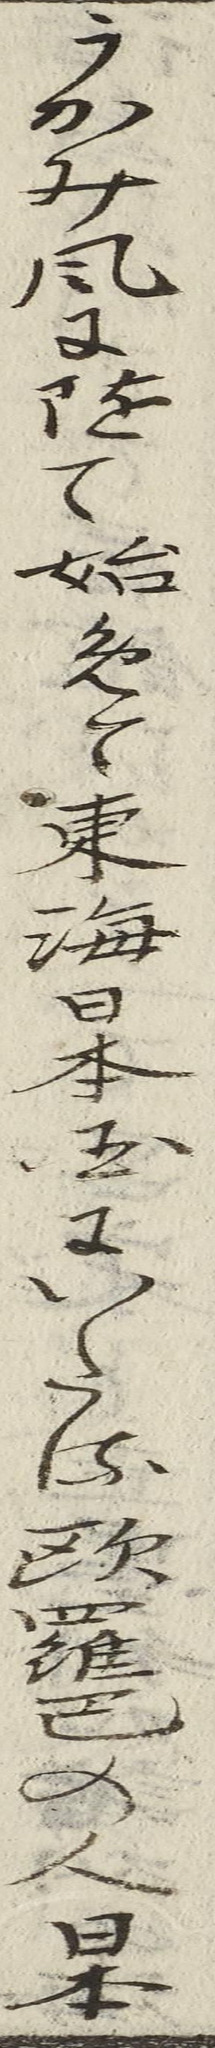うかみ風を随て始て東海日本国にいたる欧羅巴の人日本

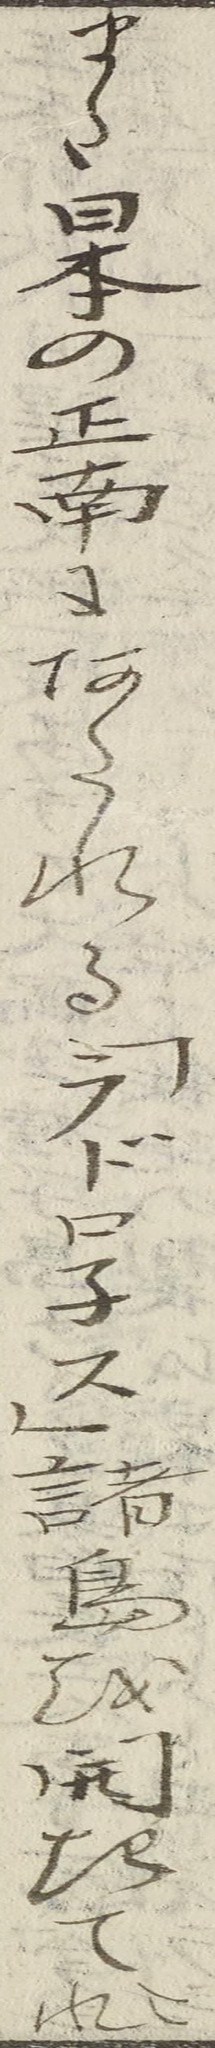また日本の正南にあたれる「ラドロ子ス」諸島開きてこれ
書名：西洋雜記　乾
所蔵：東京大学地震研究所図書室 Earthquake Research Institute Library, The University of Tokyo, JAPAN
